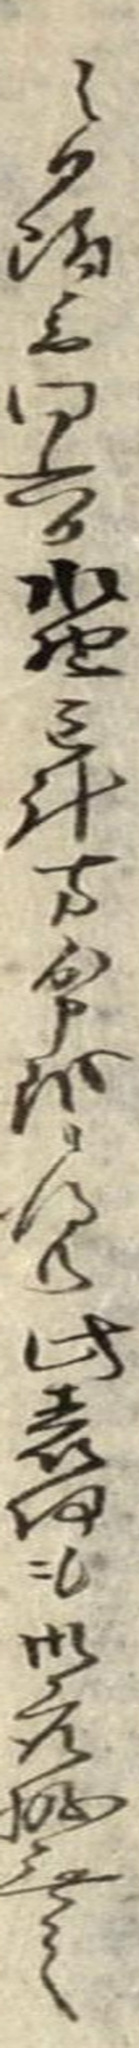之日附にて同六日水野主計方ゟ申越候得共此表何も御取扱無之
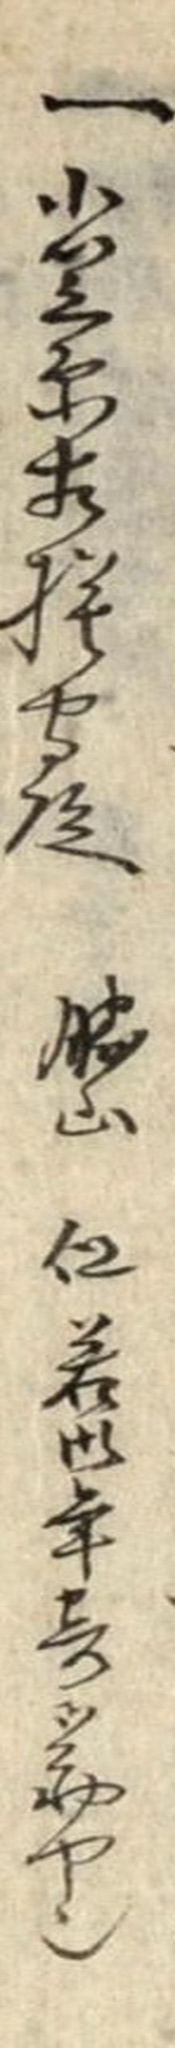一小笠原相模守殿勝山但若御年寄御勤中也
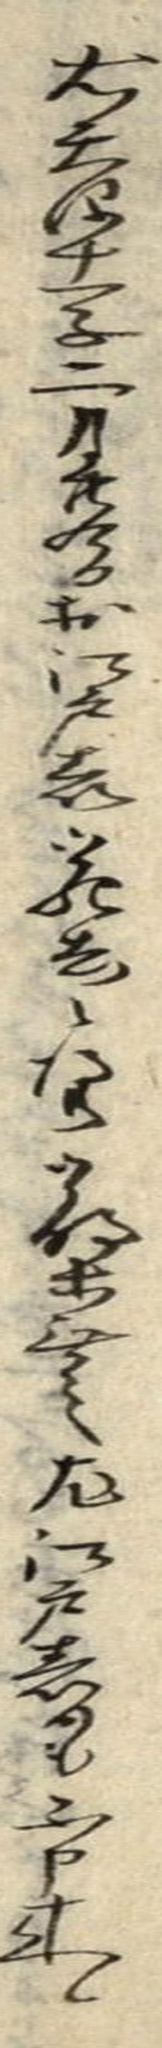右天保十一子二月廿九日於江戸表御死去候得共御触等無之尤江戸表ゟも不申来候
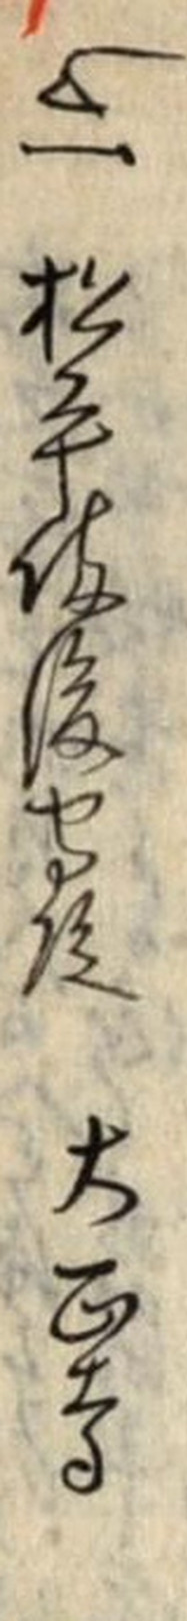△一松平備後守殿大正寺

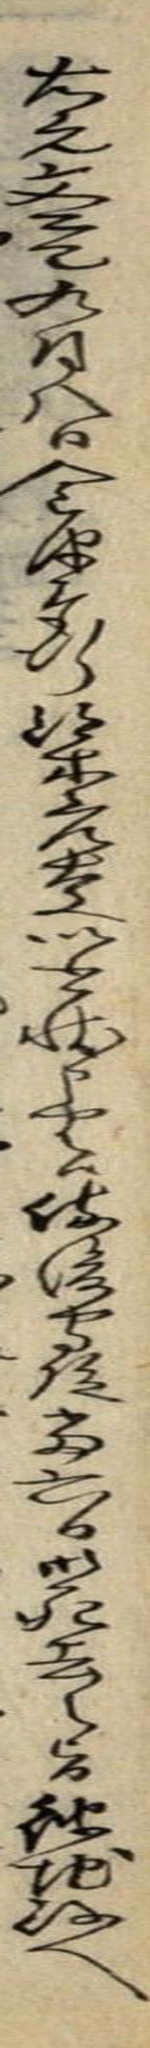右元文二巳九月八日金津奉行鈴木彦大夫以書状申聞候は備後守殿当六日御死去之旨彼地役人
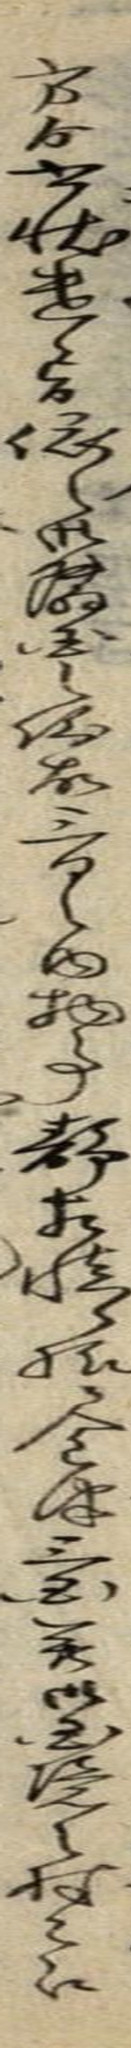方ゟ書状遣候旨依之御隣国之儀故三日之内物事静相慎候様に金津三国并御国境之村々え
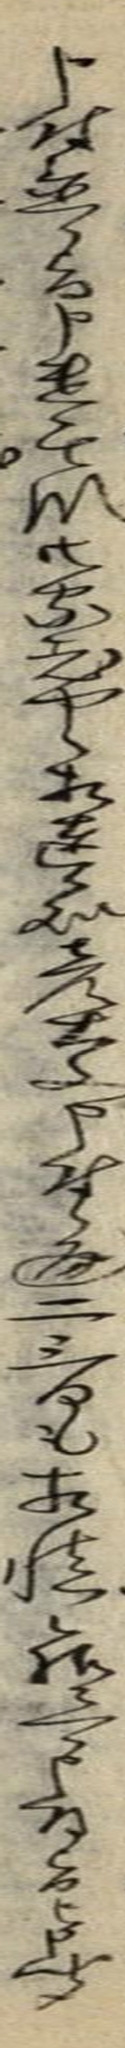申付置候旨申遣其段御家老中へ相達候処彦大夫申付候通二三日も相慎候様に可申付旨被申聞
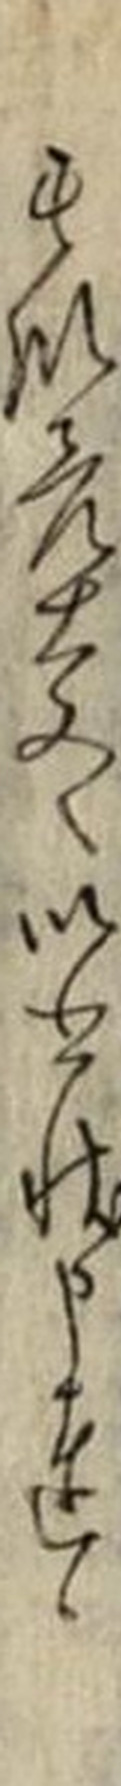其段彦大夫へ以書状申達候
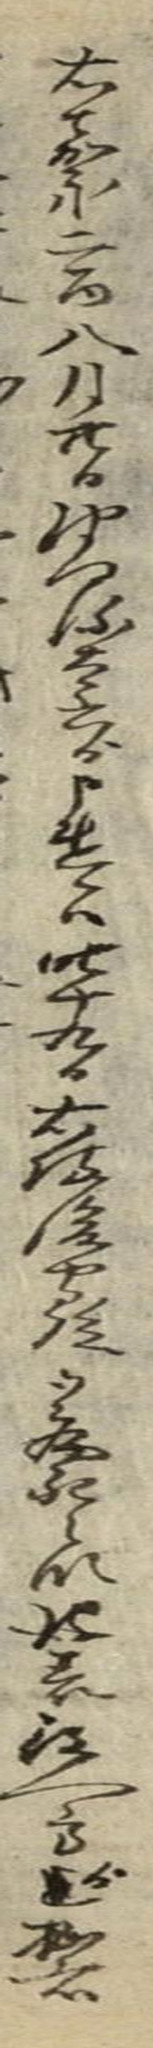右嘉永二酉八月廿日津田弥太六ゟ申遣候は昨十九日右備後守殿御病死之段彼表役人方ゟ拙者
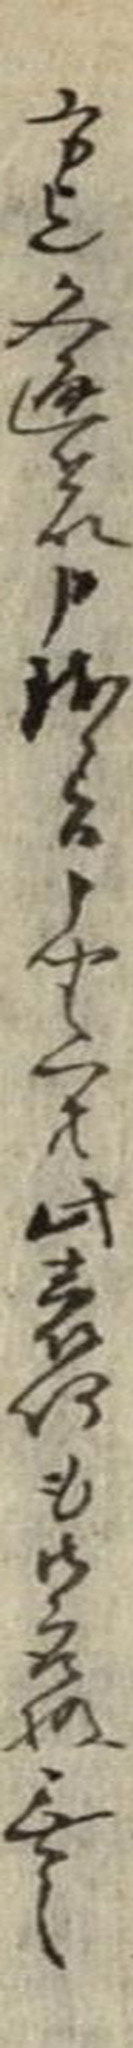方迄文通を以申越候旨申聞候へ共此表何も御取扱無之

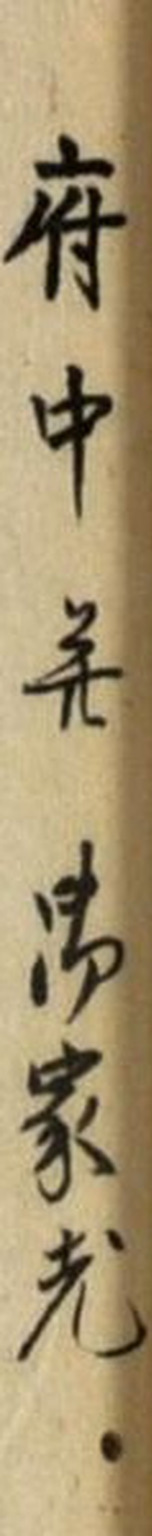府中并御家老
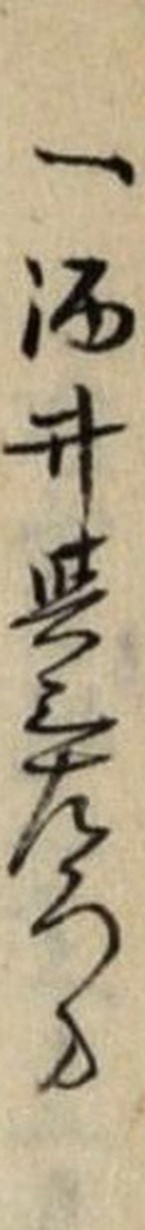一酒井与三左衛門方
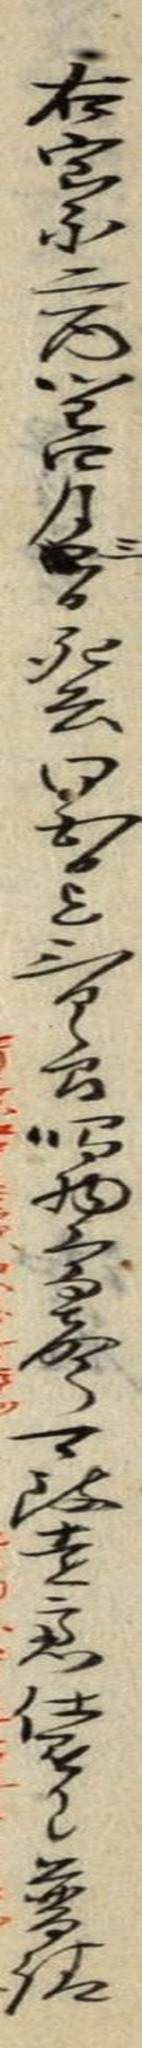右宝永二酉閏四月三日死去同五日迄三日之間鳴物高声可致遠慮仕懸り候普請
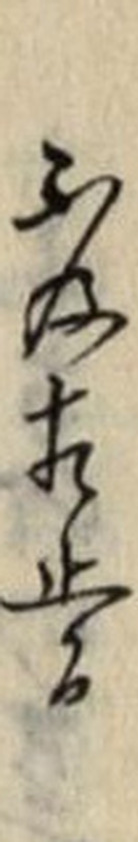不及相止旨
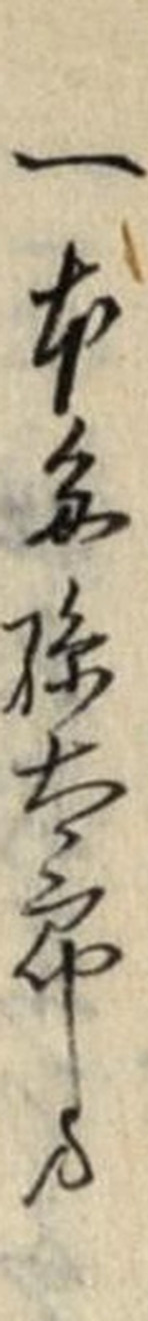一本多孫太郎方
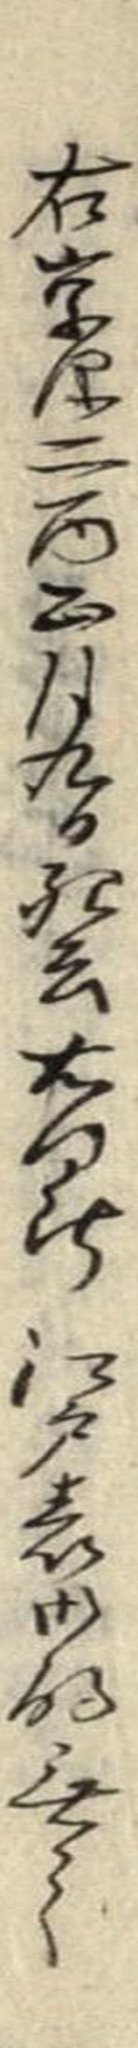右享保二酉正月九日死去右同断江戸表御触無之
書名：御停止異変死失
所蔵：福井県文書館 Fukui Prefectural Archives
